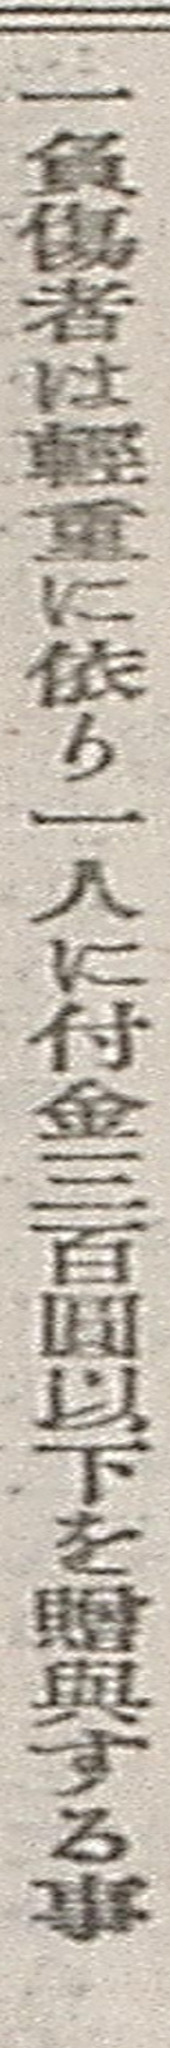一負傷者は軽重により一人に付金三百円以下を贈与する事
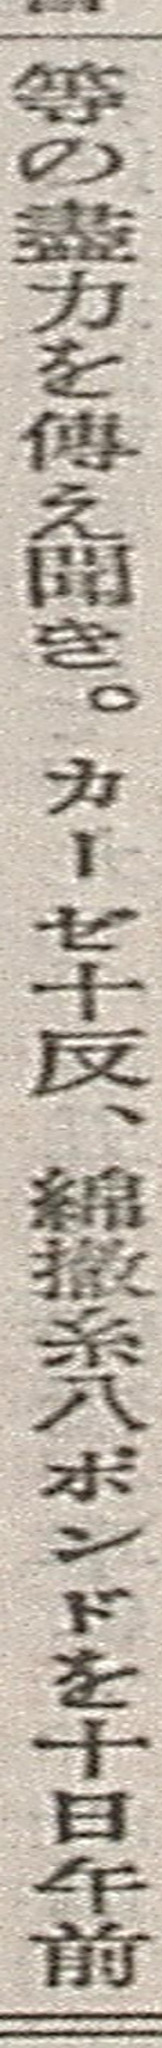等の尽力を伝え聞き。カーゼ十反、綿撒糸八ポンドを十日午前
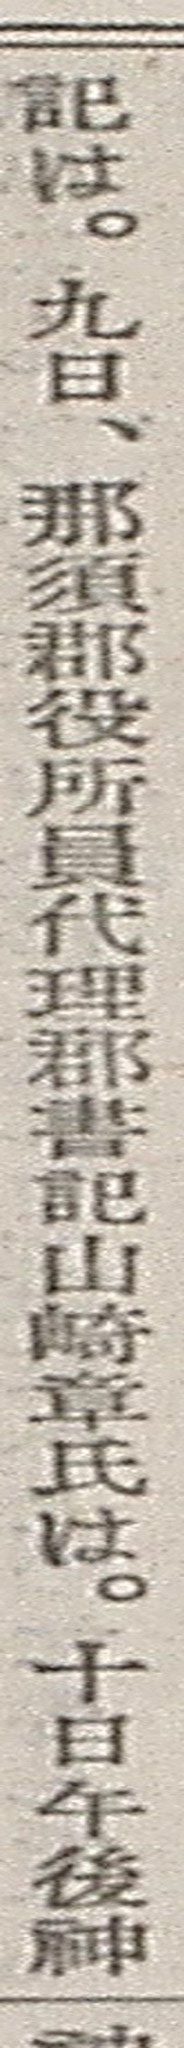記は。九日、那須郡役所員代理郡書記山崎章氏は。十日午後神
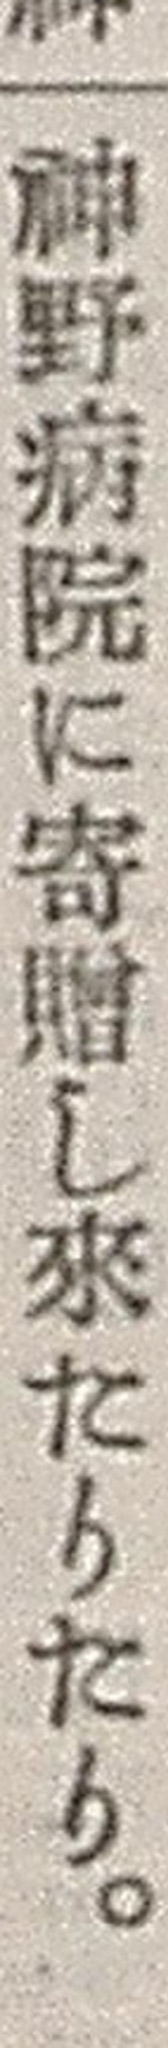神野病院に寄贈し来たりたり。
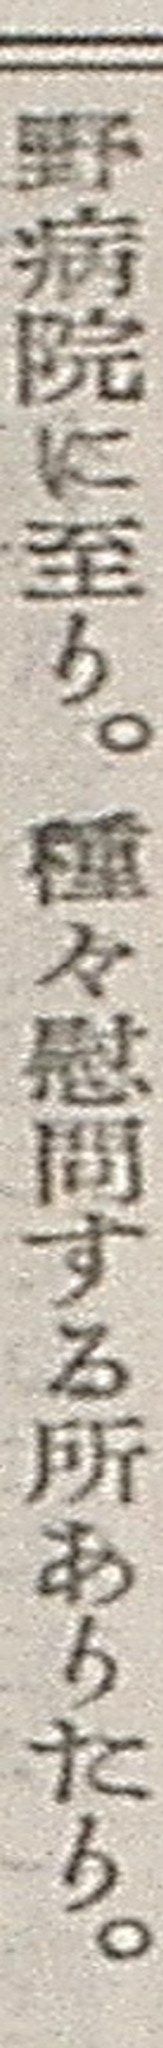野病院に至り。種々慰問する所ありたり。
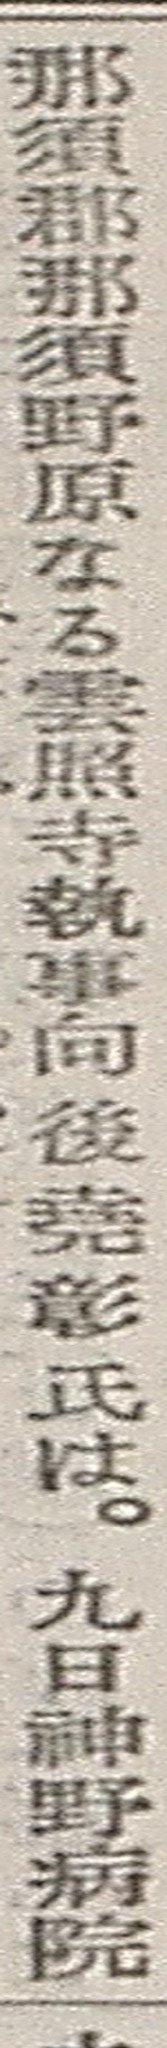那須郡那須野原なる雲照寺執事向後堯彰氏は。九日神野病院
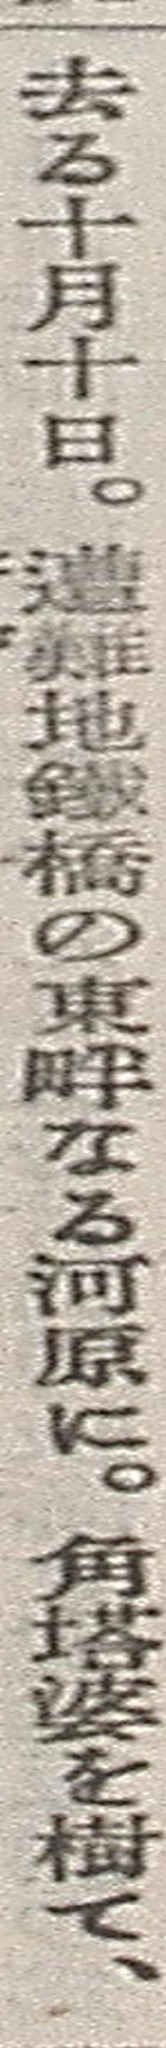去る十月十日。遭難地鉄橋の東畔なる河原に。角塔婆を樹て、
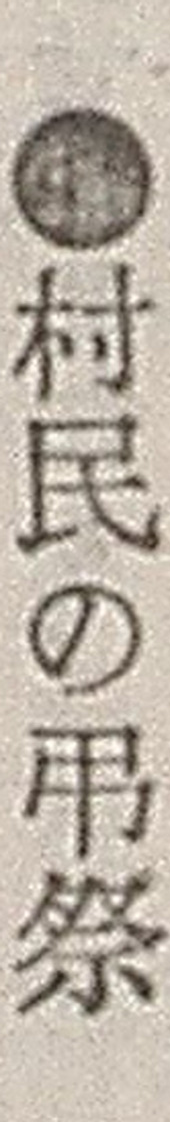●村民の弔祭
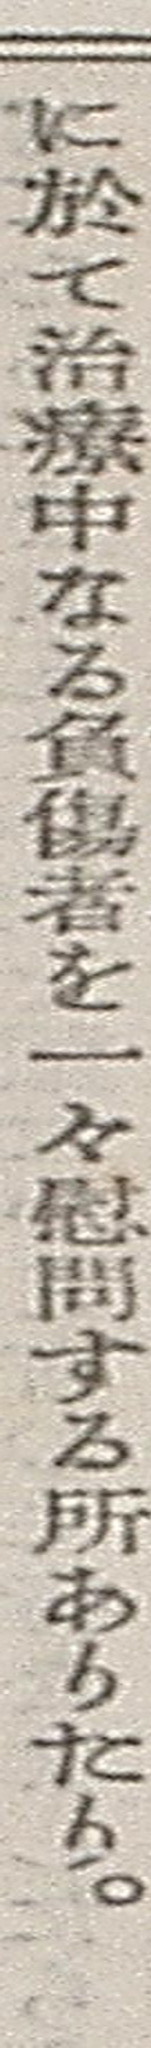に於て治療中なる負傷者を一々慰問する所ありたり。
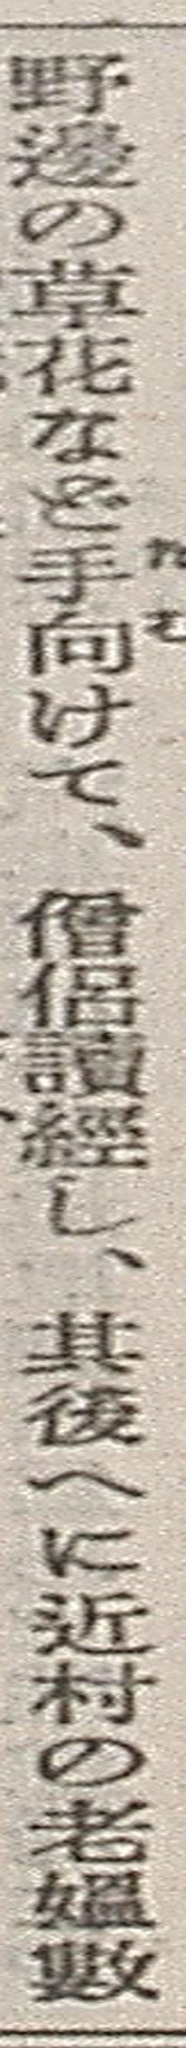野辺の草花など手向けて、僧侶読経し、其後へに近所の老媼数
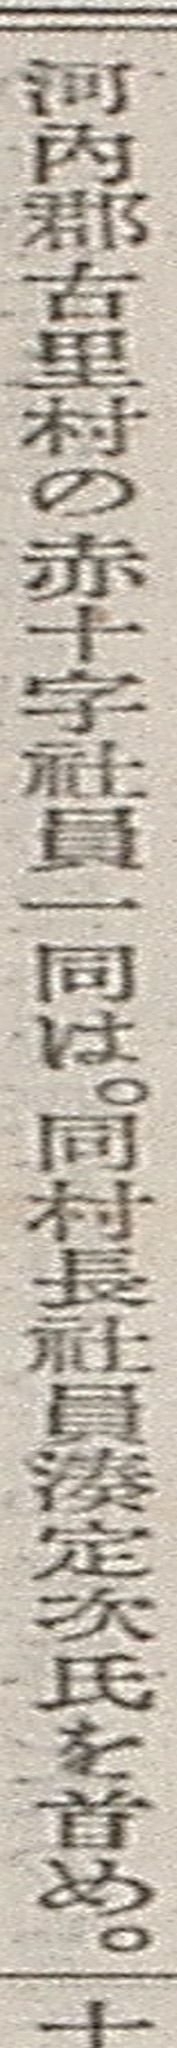河内郡古里村の赤十字社員一同は。同村長社員湊定次氏を首め。
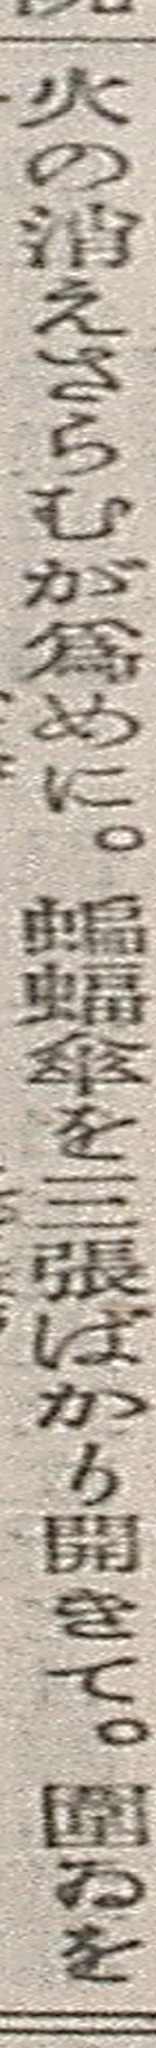火の消えさらむが為めに。蝙蝠傘を三張ばかり開きて。囲ゐを
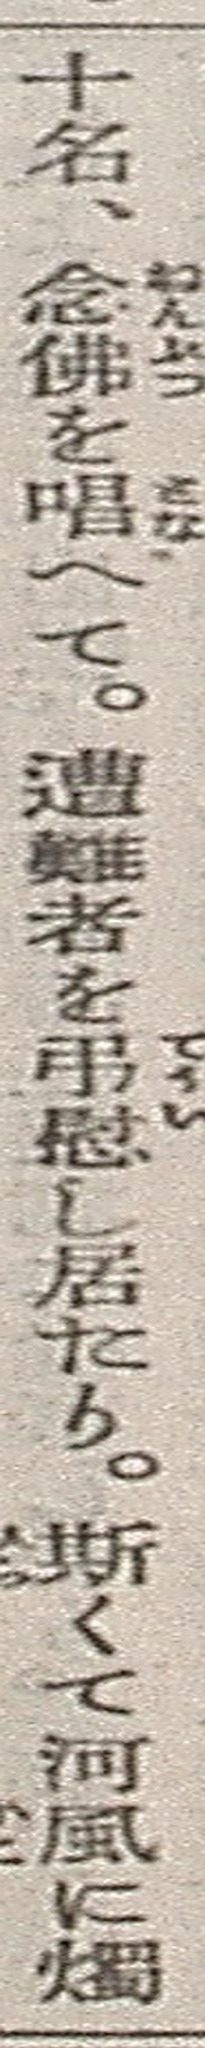十名、念佛を唱へて。遭難者を弔慰し居たり。斯くて河風に燭
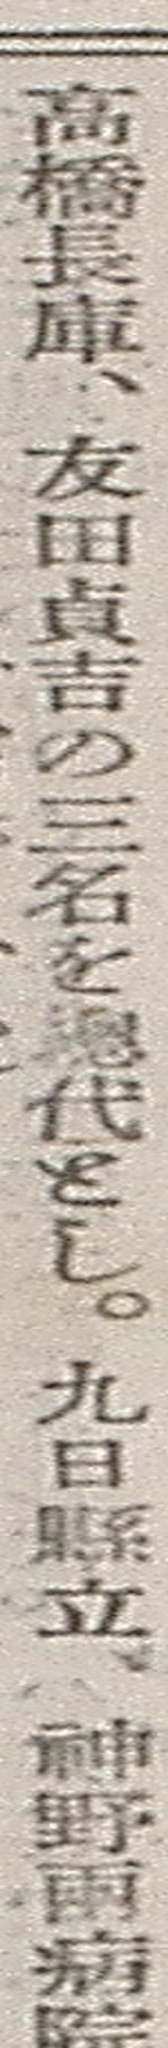高橋長庫、友田貞吉の三名を総代とし。九日県立、神野両病院
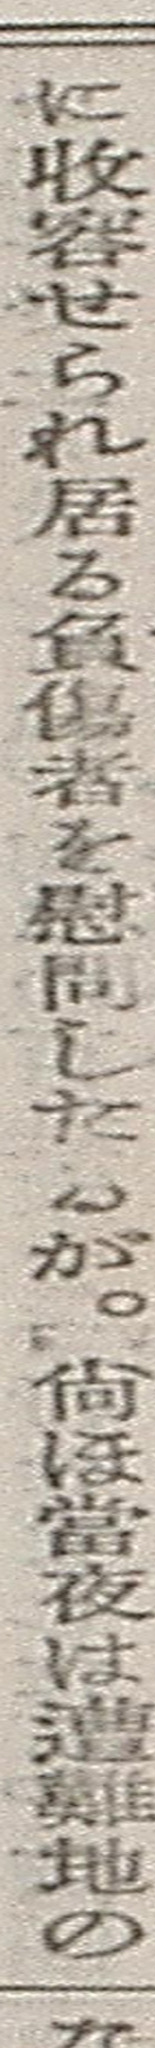に収容せられ居る負傷者を慰問したるが。尚ほ当夜は遭難地の
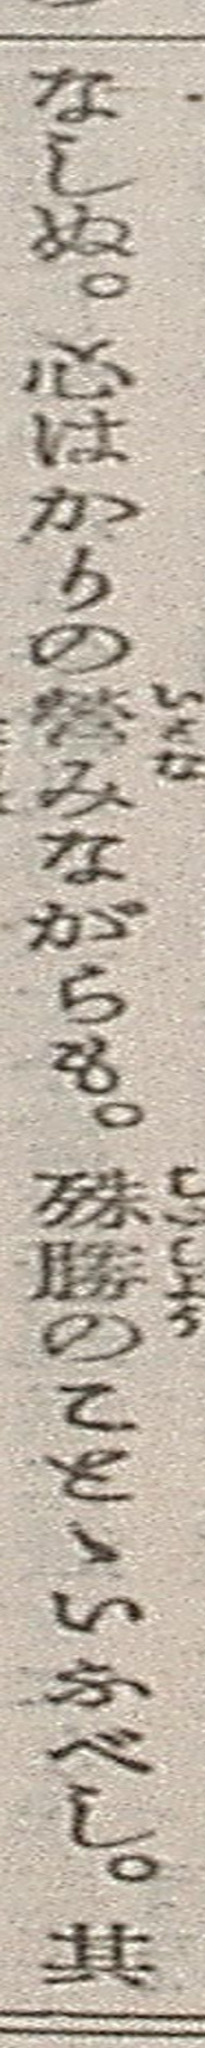なしぬ。心ばかりの営みながらも。殊勝のことゝいふべし。其
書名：風俗畫報臨時増刊第百九十九號　明治三十二年十月各地災害圖會（前編之續）
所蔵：東京大学地震研究所図書室 Earthquake Research Institute Library, The University of Tokyo, JAPAN
